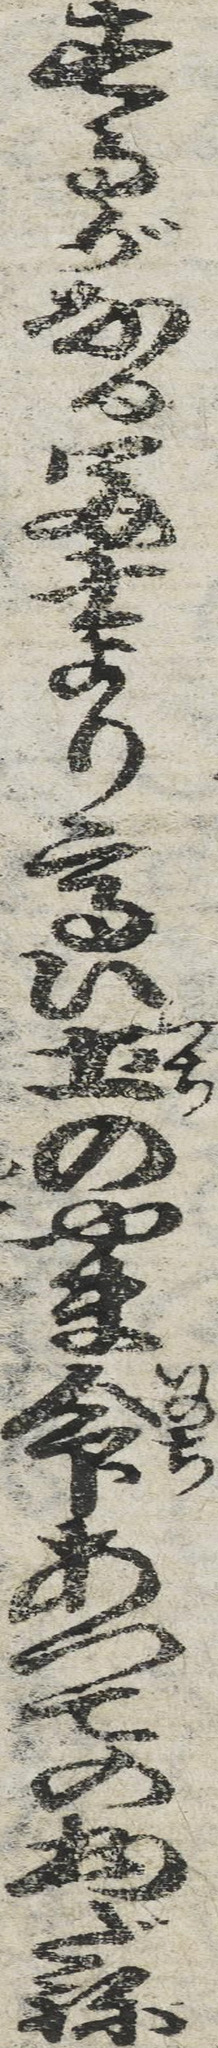するがなる富士より高い土のやま命あつての物だね
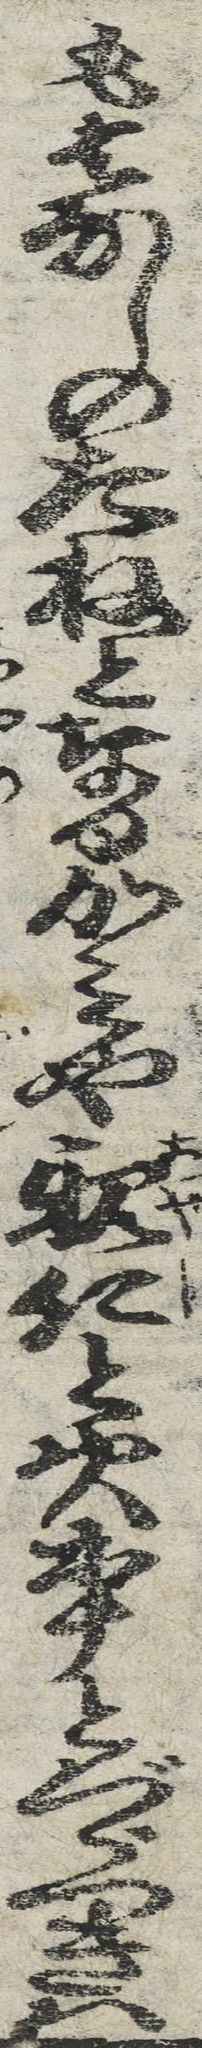もはなしのたねとなるかみや親仁と火事とぐらつきは
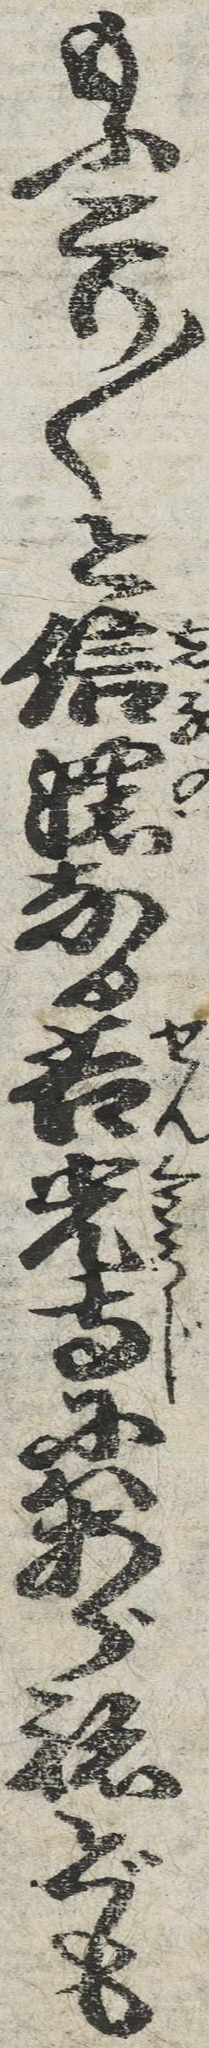もふこり〳〵と信濃なる善光寺にはあらねども
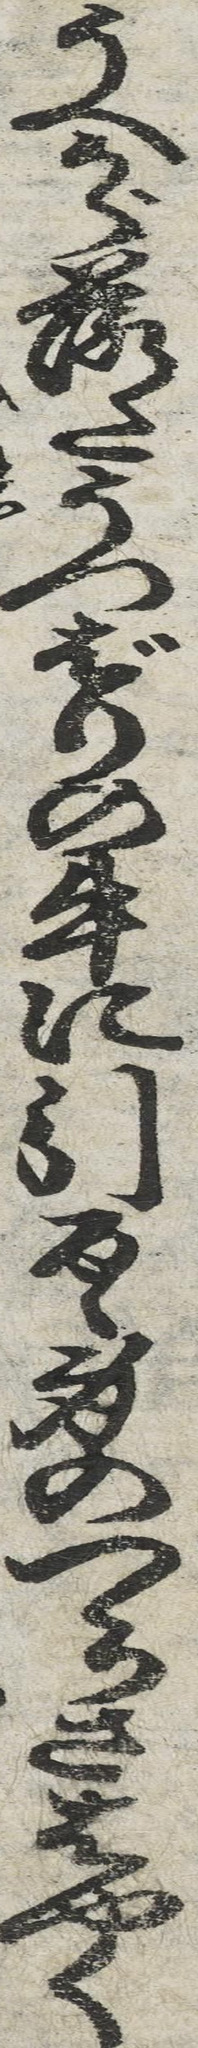うへから落たうつばりの牛に引るゝ身のつらさはやく
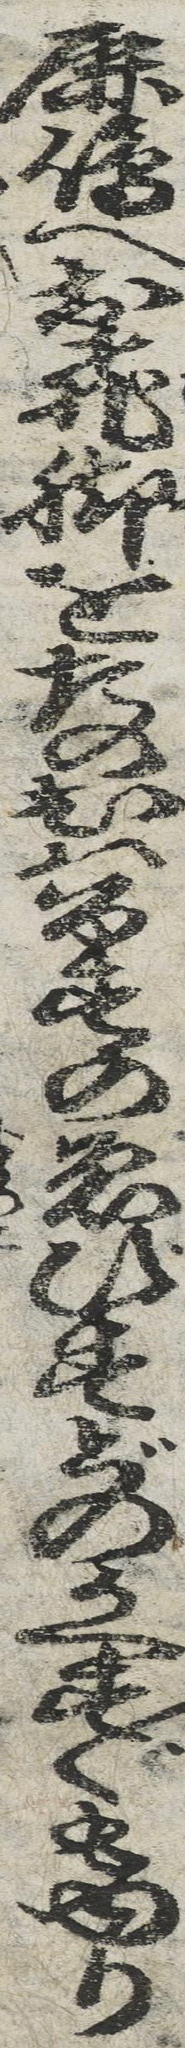鹿嶋へお飛脚をたのむは留すのゑびすどのかへす〴〵もゆり
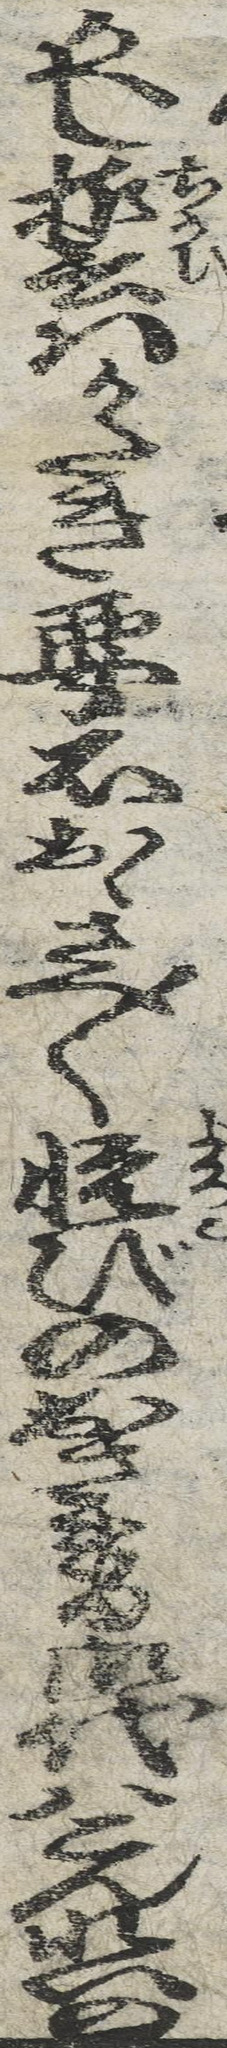かへし誓はかたき要石おゝさへ〳〵悦びのおさまる御代はこんれいの
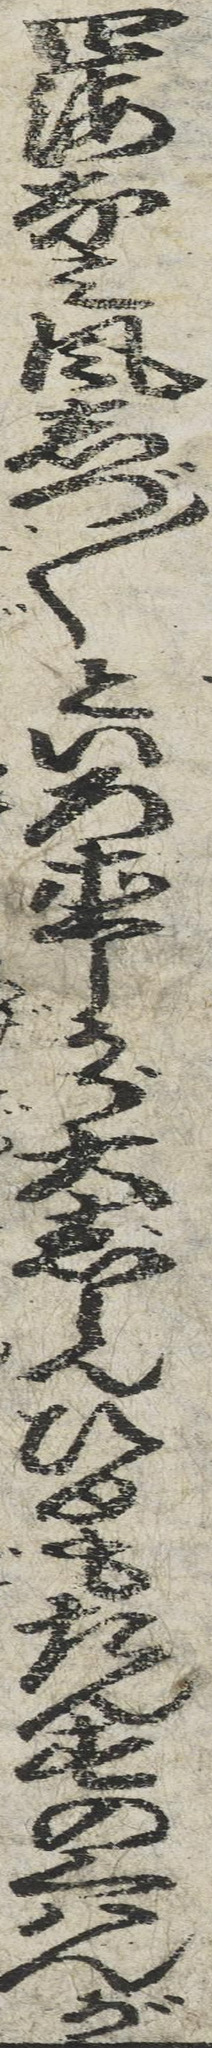四海なみ風しづ〳〵といろ直しから大じしんひるもたんすのくはんが
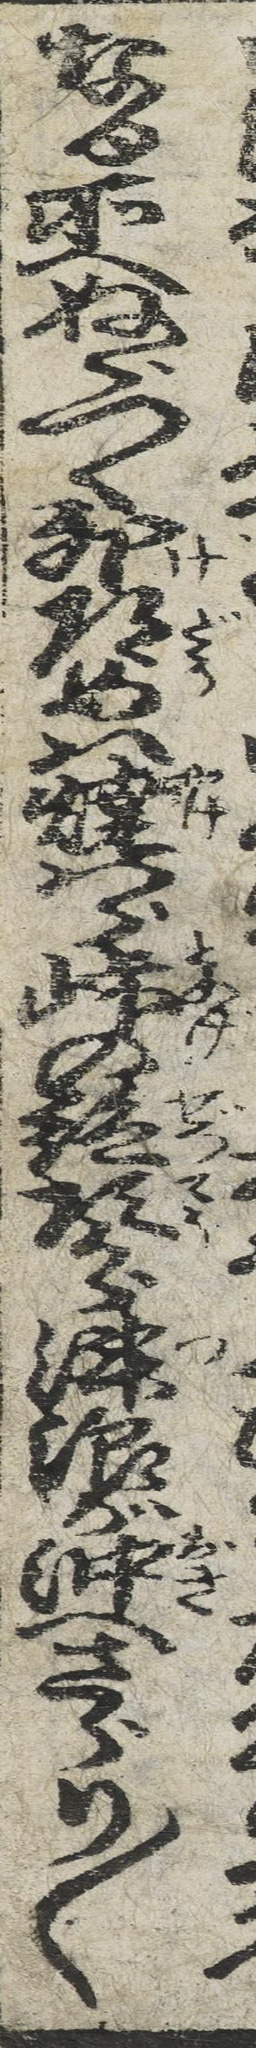なる所へぬらつく外道めは焼はら峠の絶頂から津浪が沖へさらり〳〵

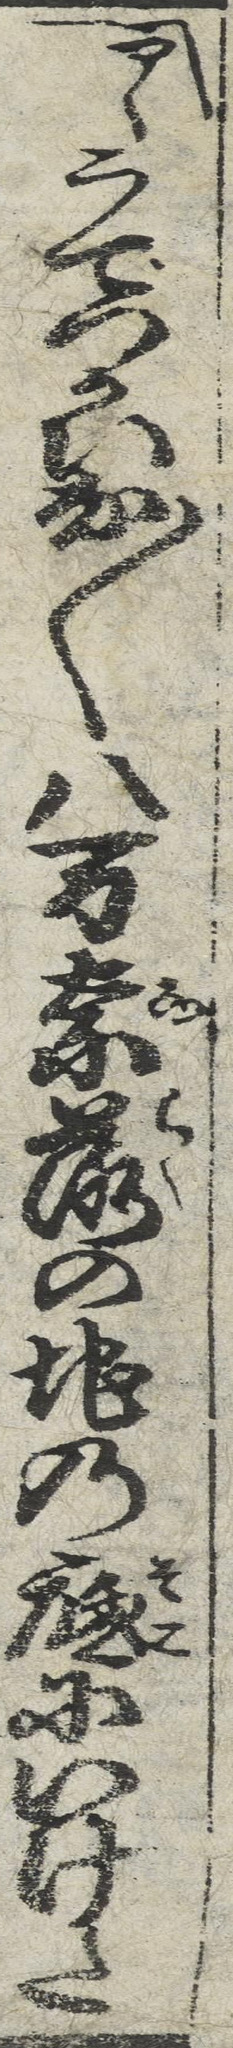〽アヽラてつかいな〳〵八万奈落の地の底にいけた
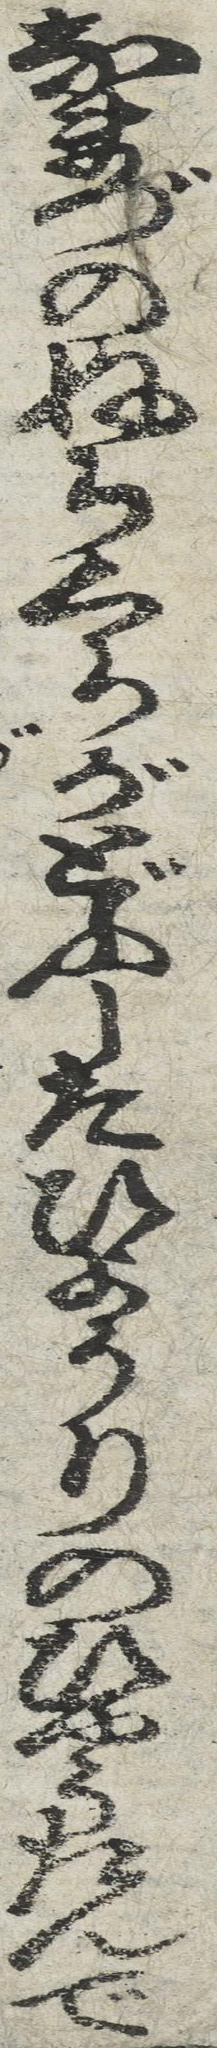なまづのぬらくらがどふしたひようりのひやうたんで
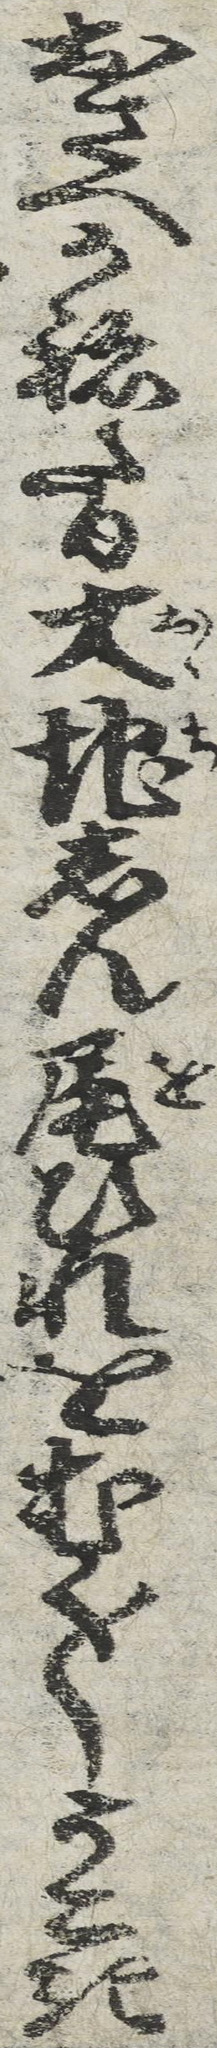おさへかねたる大地しん尾ひれをむく〳〵うこき
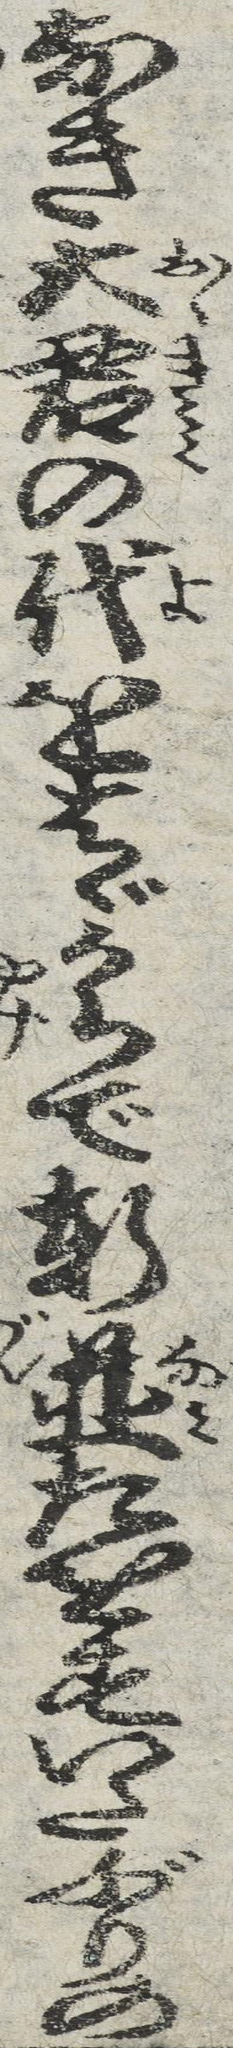なき大君の代をはゞからで軒並たをすいたぶりの
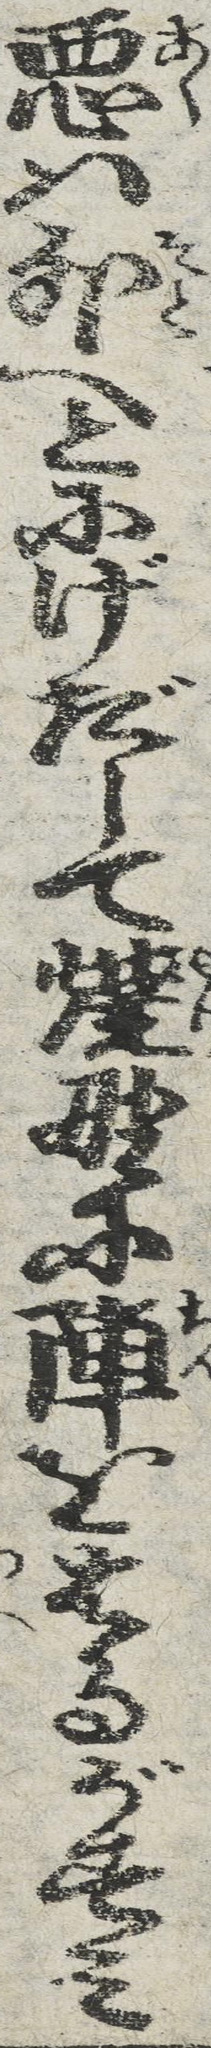悪は外へとにげだして焼野に陣をはるがすみ
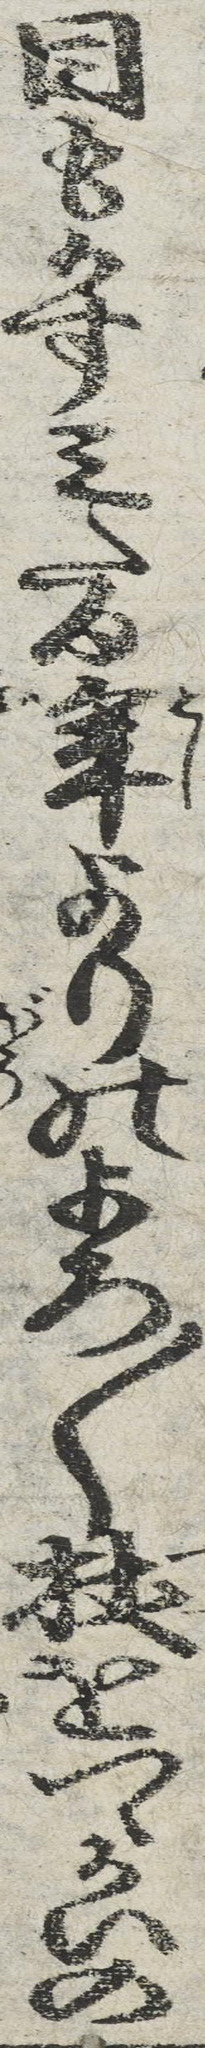目もかすみたる年よりのよろ〳〵杖をつゝかいの
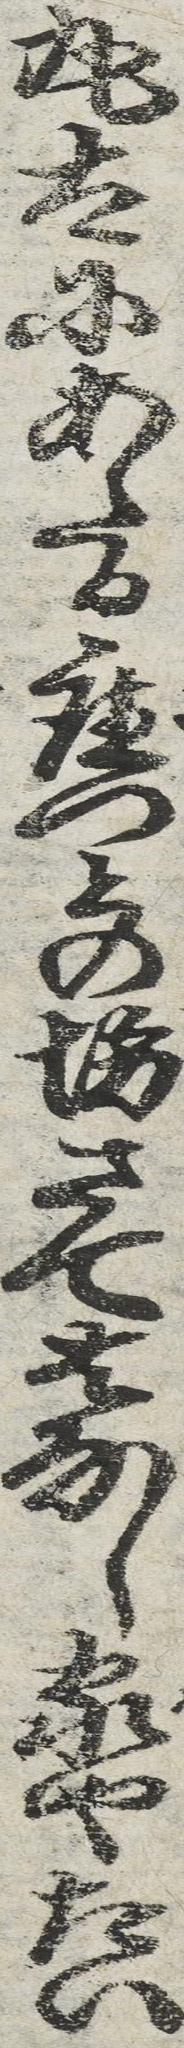丸太にあたる座つとの坊さてはなし家やたい
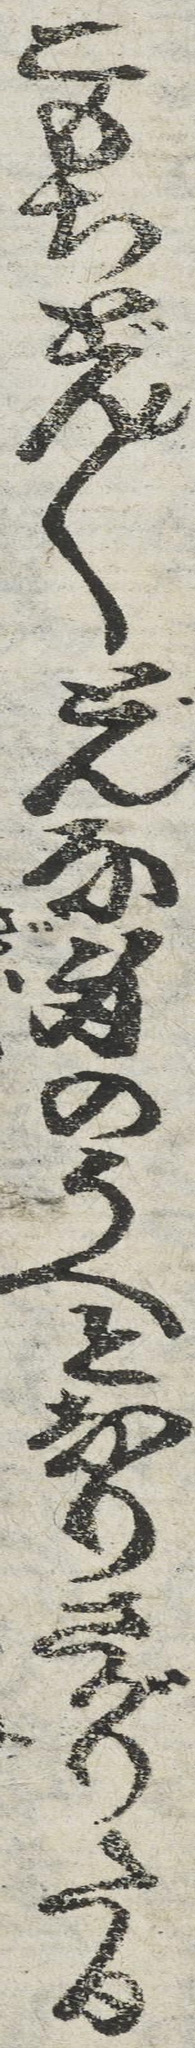こもちどん〳〵どんな身のうへとなりさがりたる
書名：地震やくはらひ
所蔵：東京大学地震研究所図書室 Earthquake Research Institute Library, The University of Tokyo, JAPAN
